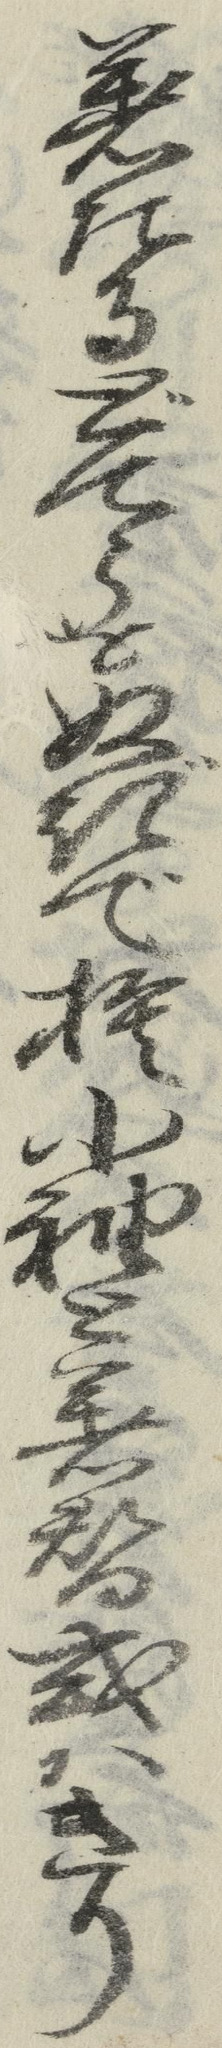着たるどてらをぬぎで捨小袖と着替或はきり
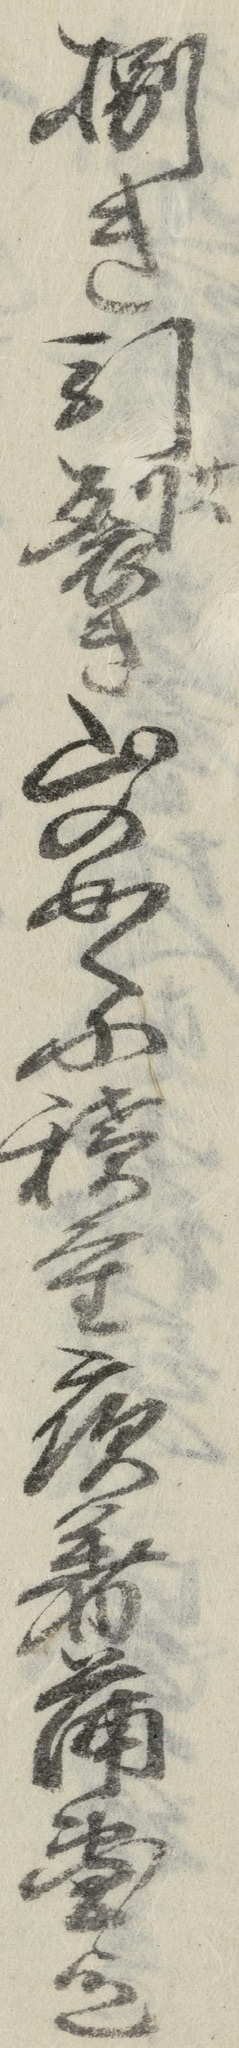捌き引裂き山の如くに積重夜着蒲団迄
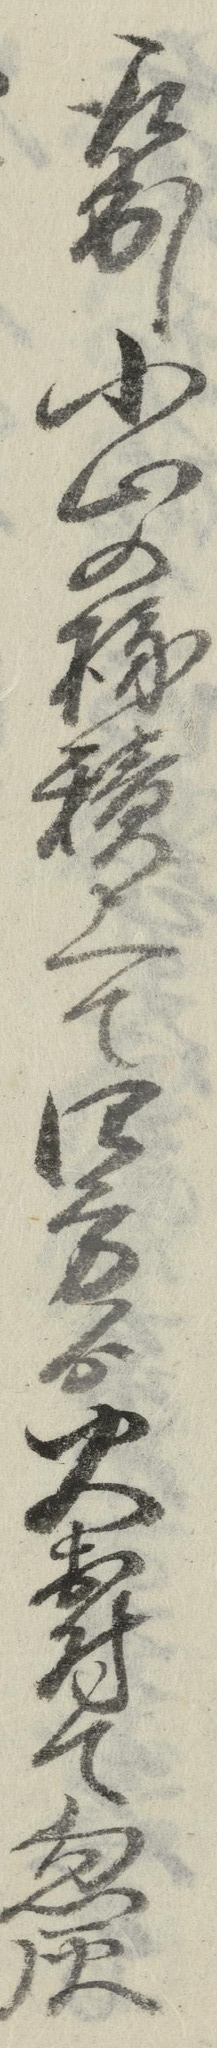取出し小山の様積上て四方ゟ火お付て忽灰
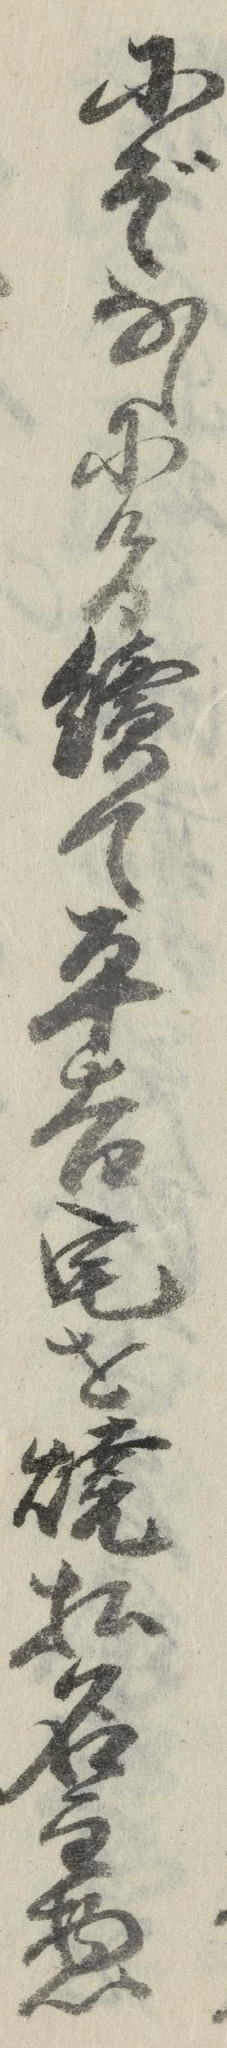にぞなしにける続て平吉宅を焼払名主惣
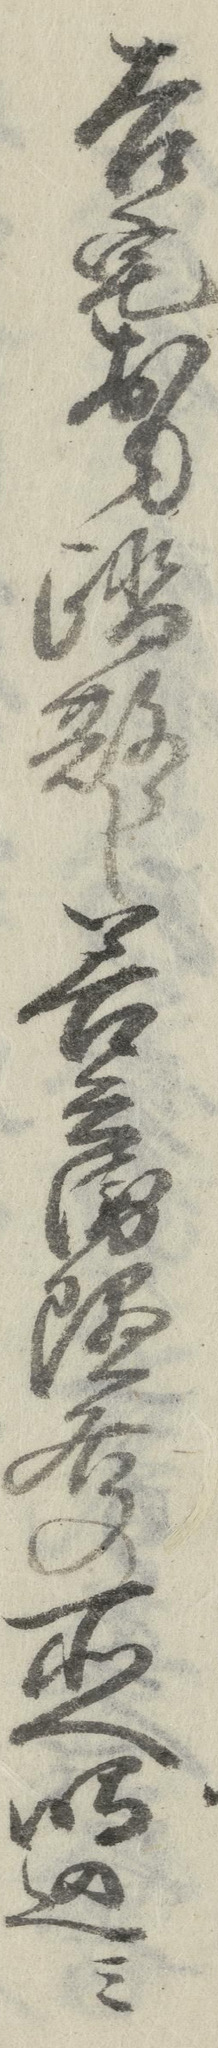吉宅おも踏散し善兵衛隠居の所へ鳴込み
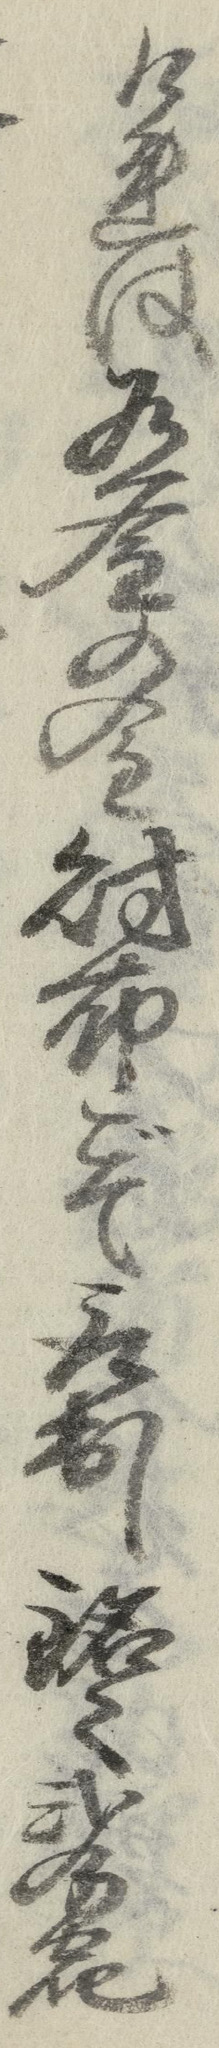けれは有金の金財布ごて取出し銘々弐分宛
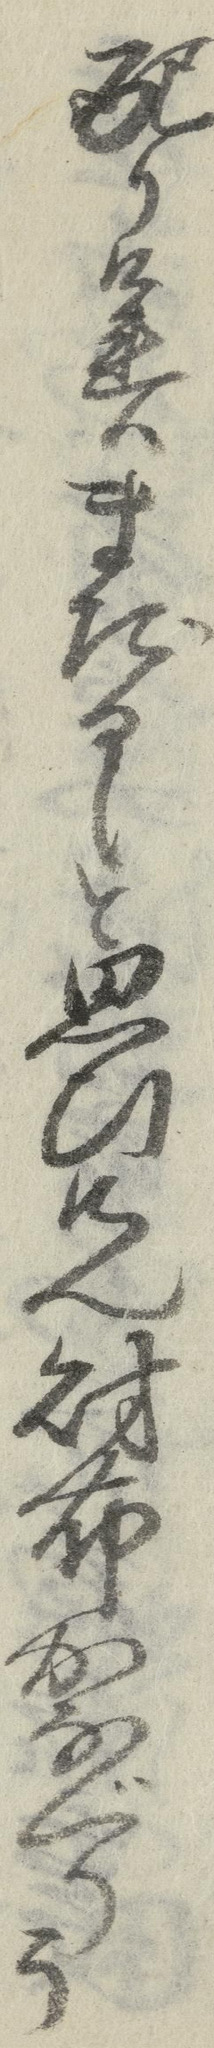配りけれはまだるしと思ひけん財布かなぐりう
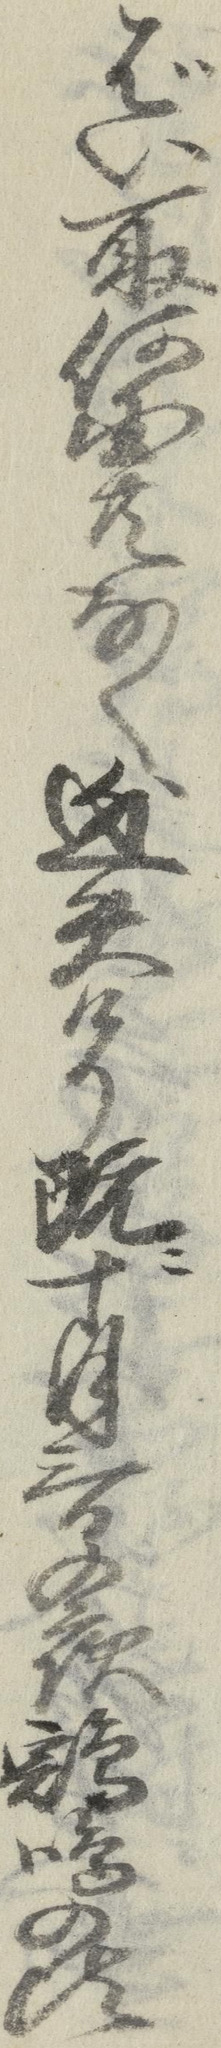ばい取何国共なく逃失けり既に十月三日の夜鶏鳴の頃
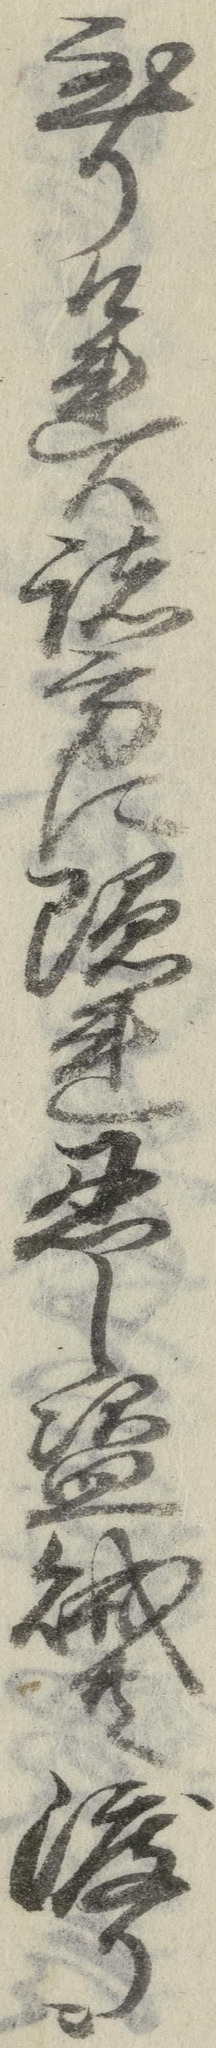至りけれは諸方に隠れ忍し盗賊共渡りに
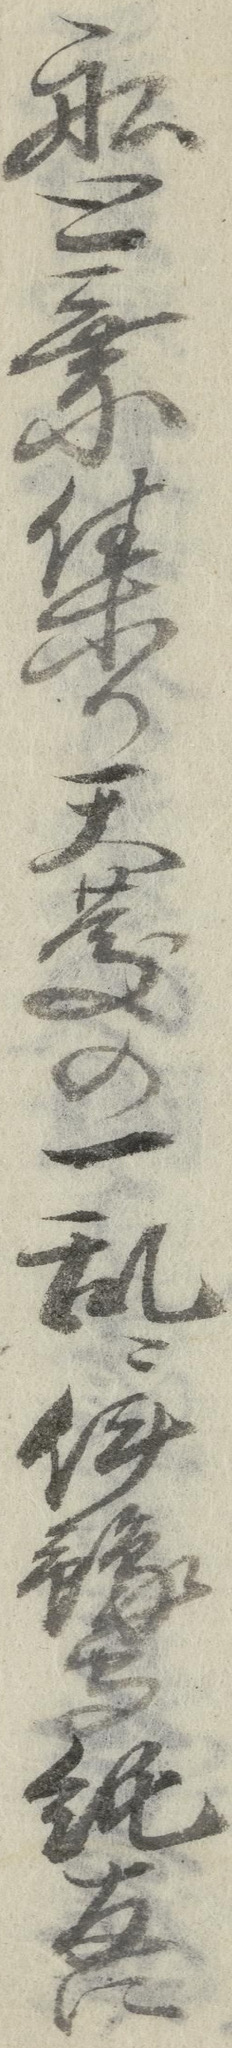舩と乗集り天慶の一乱に伊予守純友に
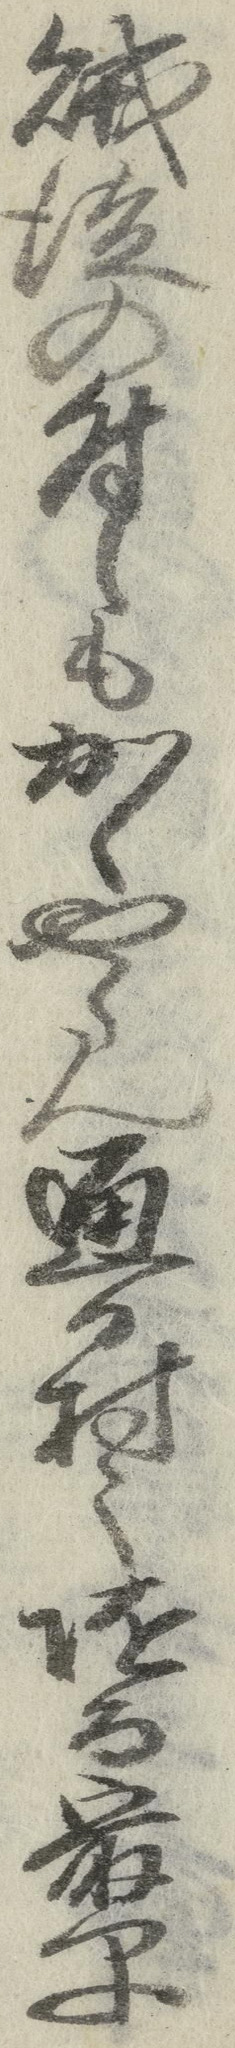賊徒の付しもかくやらん通る村々随而最早
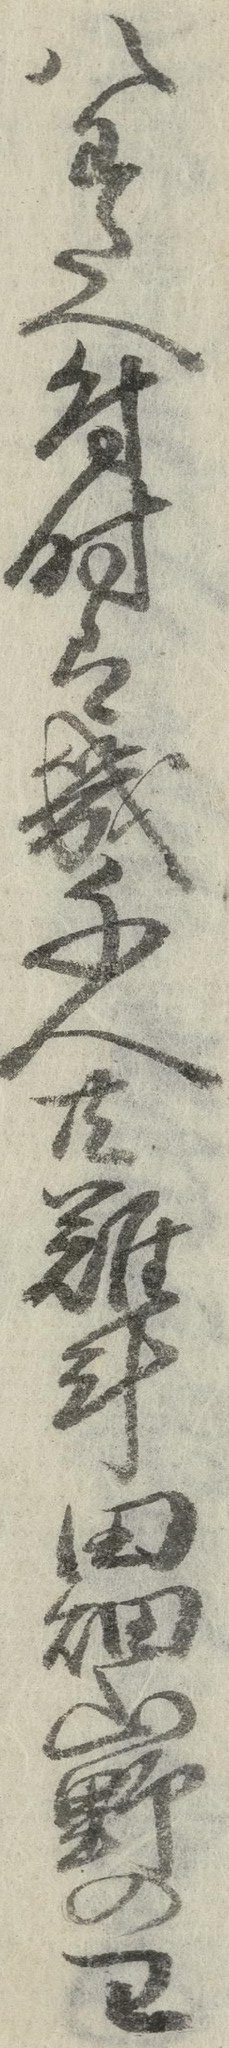八わたへ付時は幾千人共難計田畑山野のわ
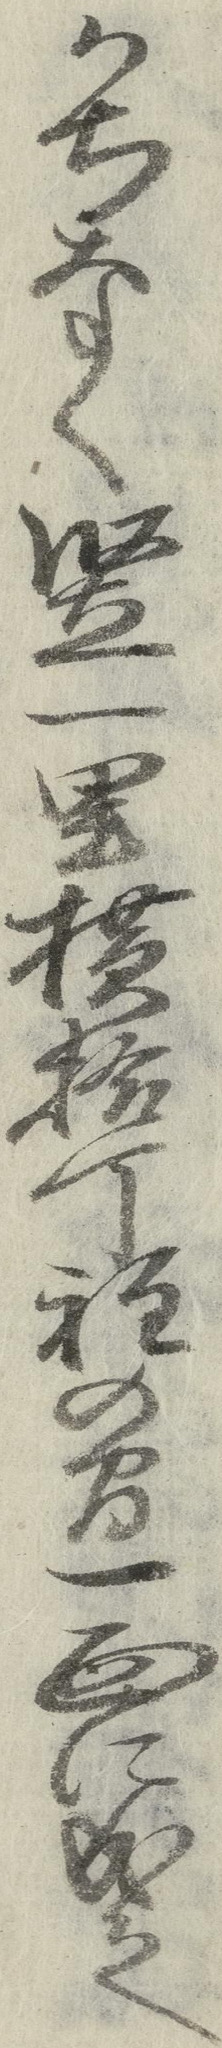かちなく竪一里横拾丁程の間一面に成て
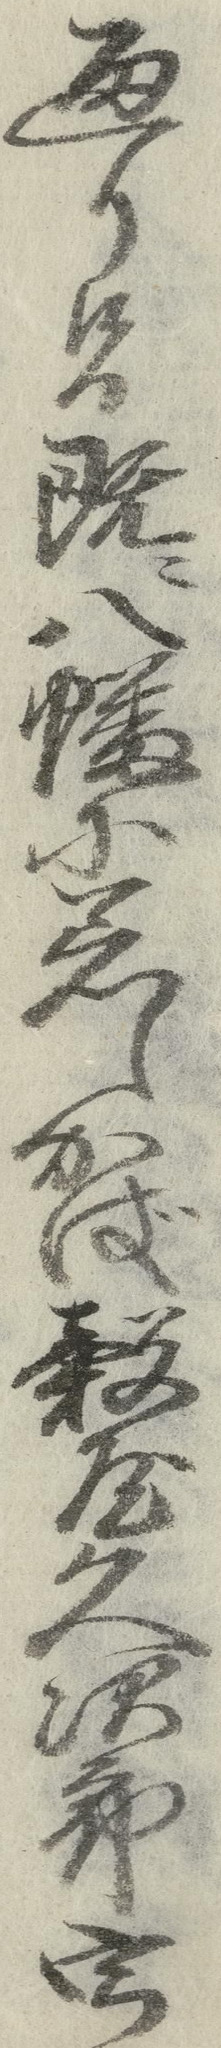通りける既に八幡に着しかば穀屋久次郎宇
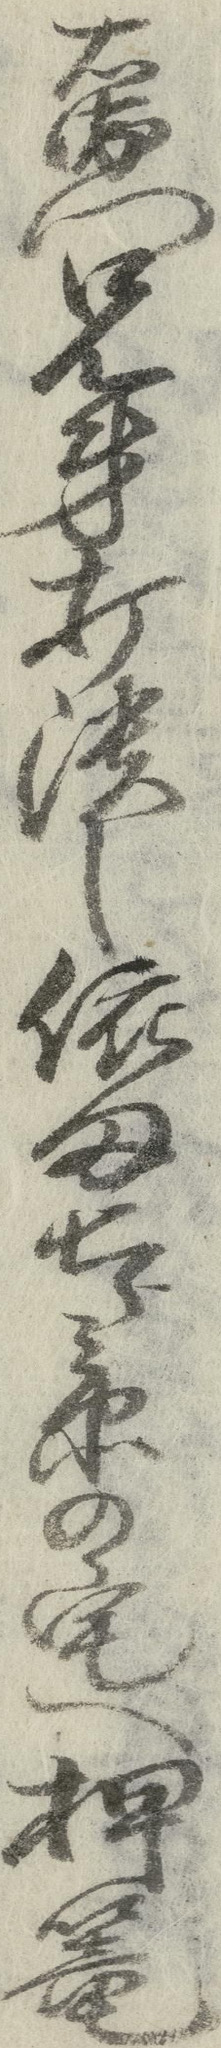右衛門兄弟打潰し依田七郎兵衛の宅へ押篭
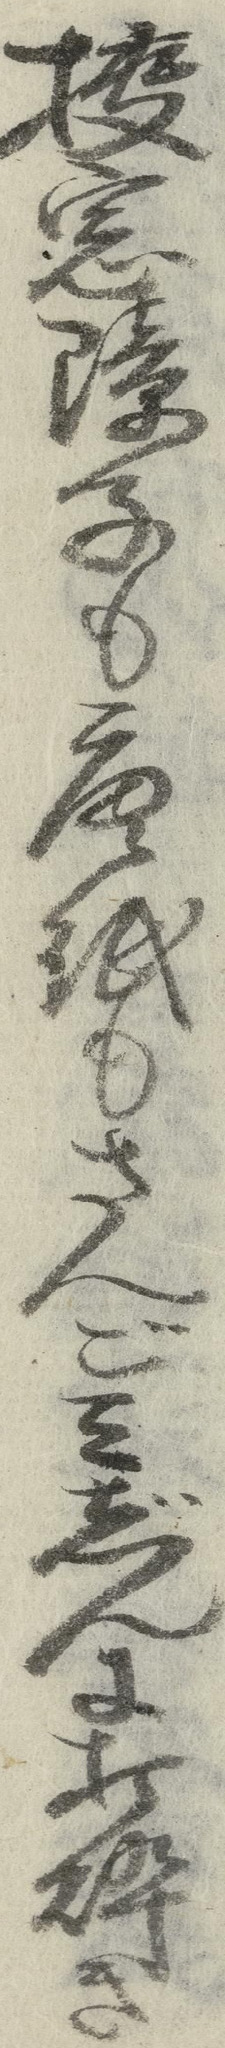捜窓障子も唐紙もさんごみじんに打砕き
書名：浅間大焼騒動記　中
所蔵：東京大学地震研究所図書室 Earthquake Research Institute Library, The University of Tokyo, JAPAN
